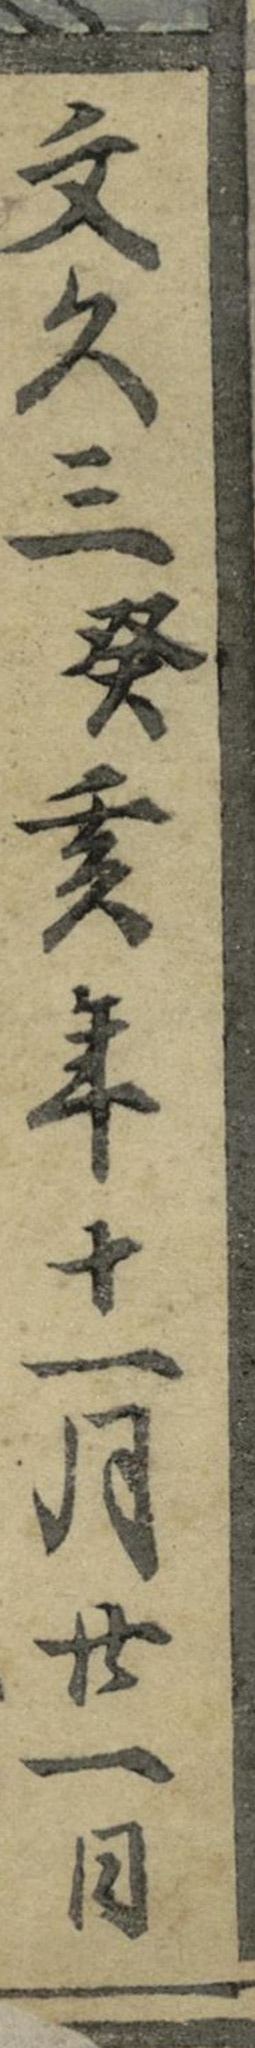文久三癸亥年十一月廿一日
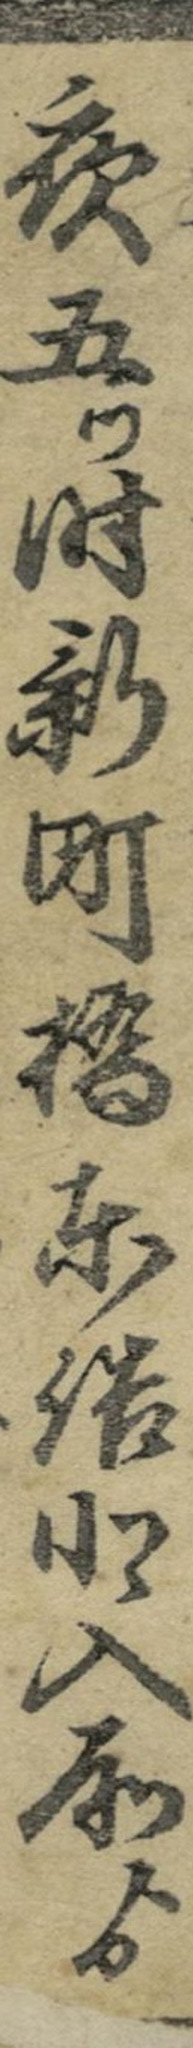夜五ッ時新町橋東詰北入所ゟ
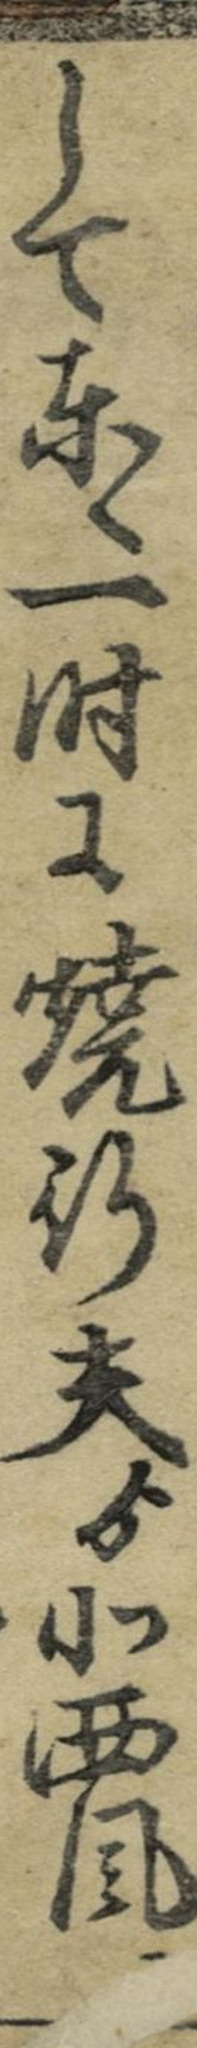して東へ一時に焼行夫ゟ北西風に
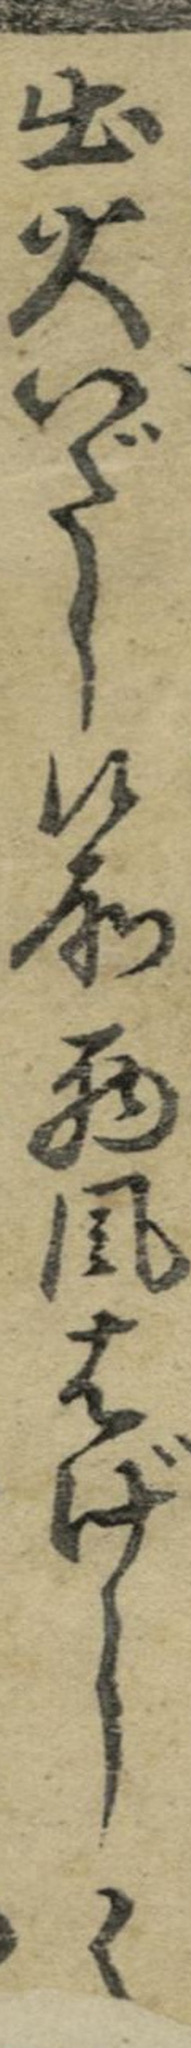出火いだし候所西風はげしく
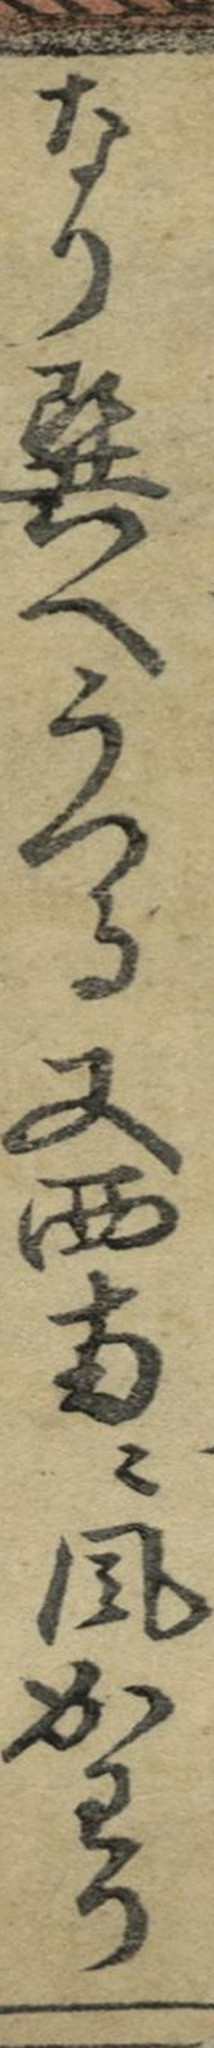なり巽へうつる又西南に風かわり
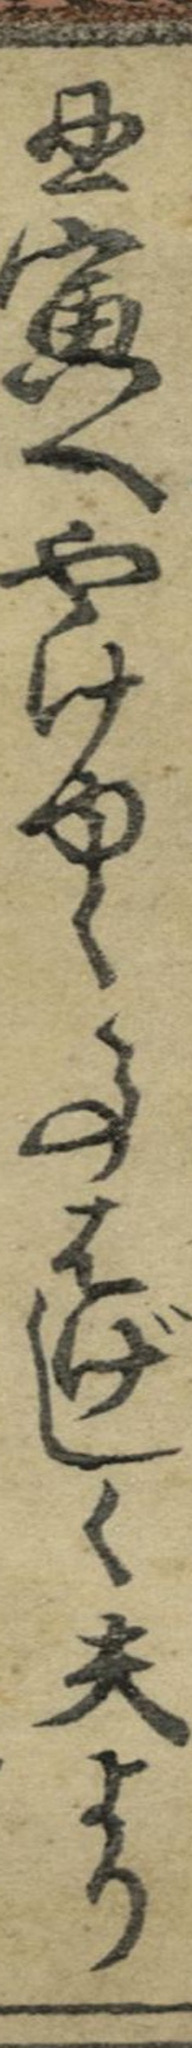丑寅へやけゆく事はげしく夫より
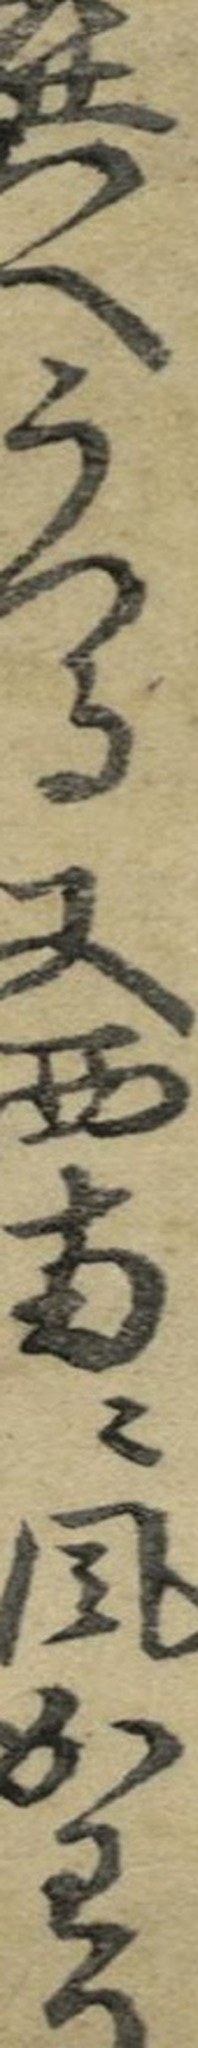なり巽へうつる又西南に風かわり
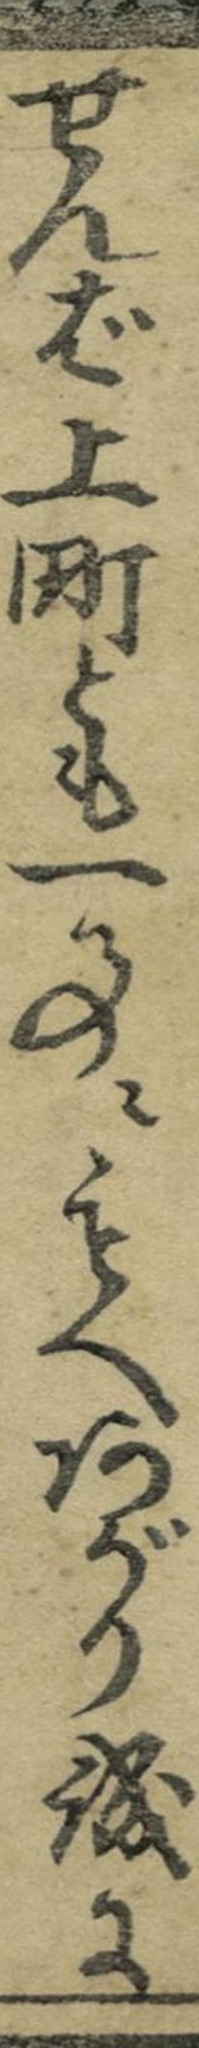せんば上町とも一事にもへあがり誠に
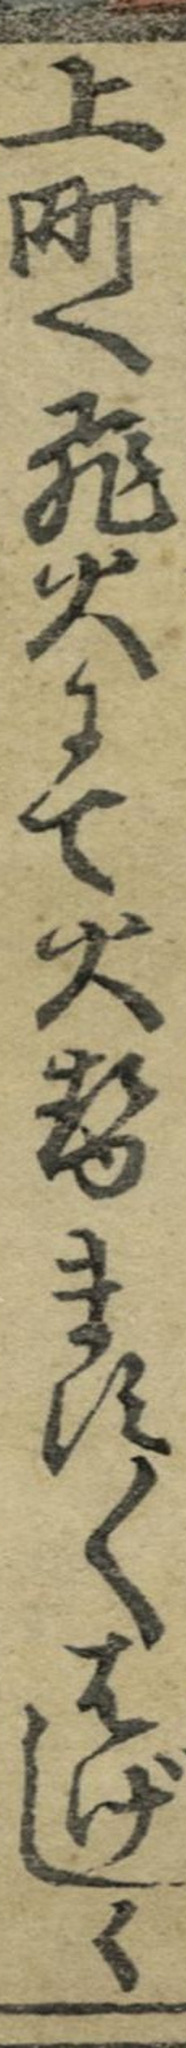上町へ飛火にて火勢ます〳〵はげしく
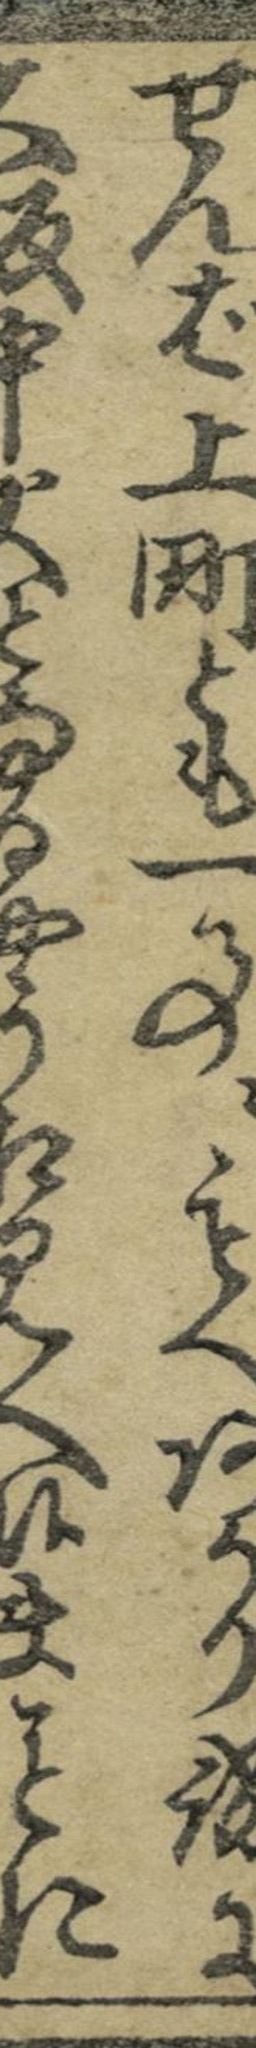大坂中火となるやう相見へ候まことに
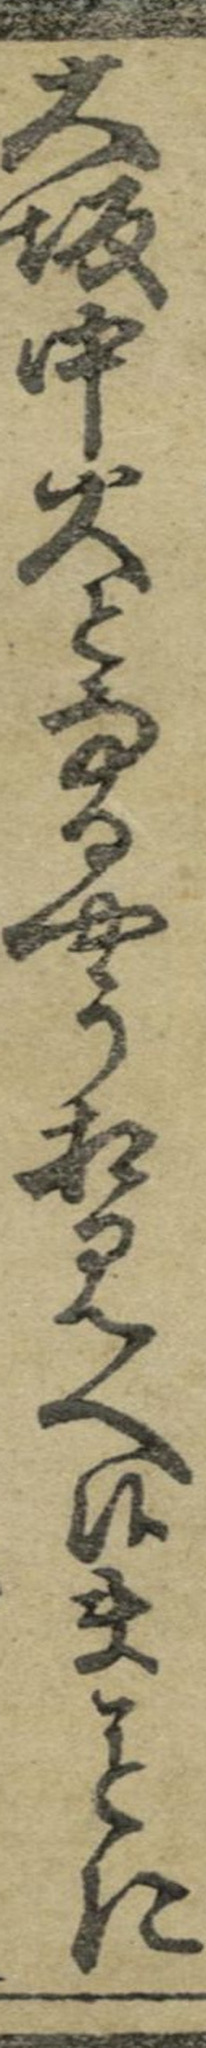大坂中火となるやう相見へ候まことに
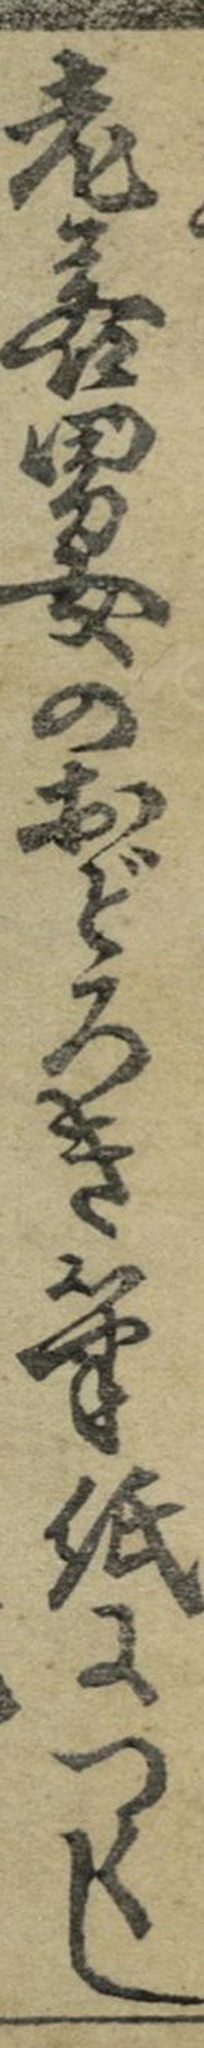老若男女のおどろき筆紙につくし
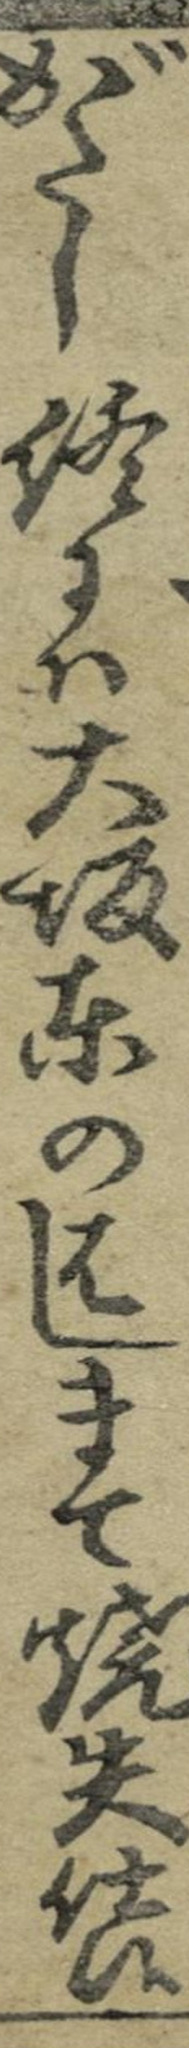がたし終には大坂東のはしまで焼失仕候
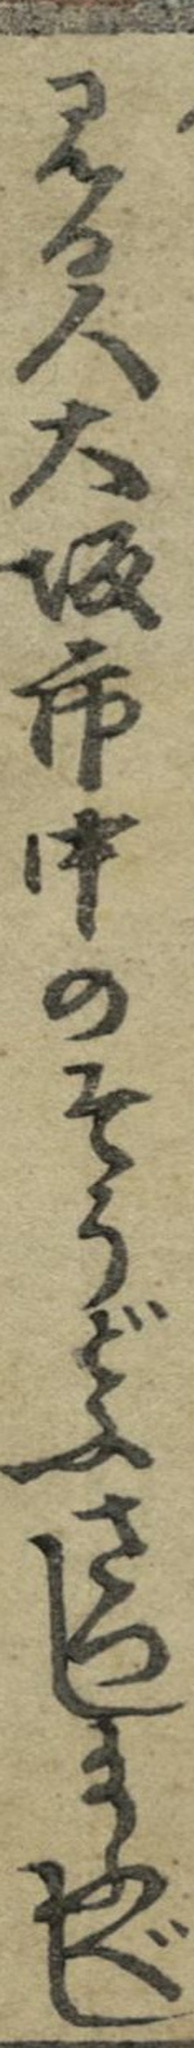見る人大坂市中のそうどふさつし給ふべし
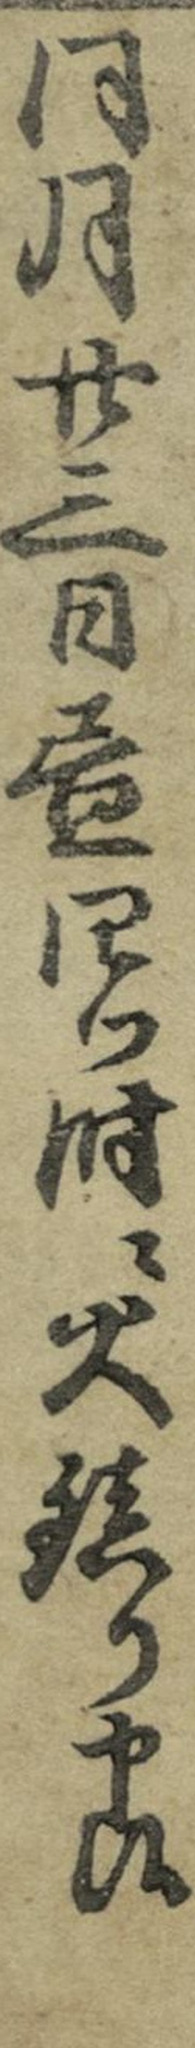同月廿三日昼四ッ時に火鎮り申候
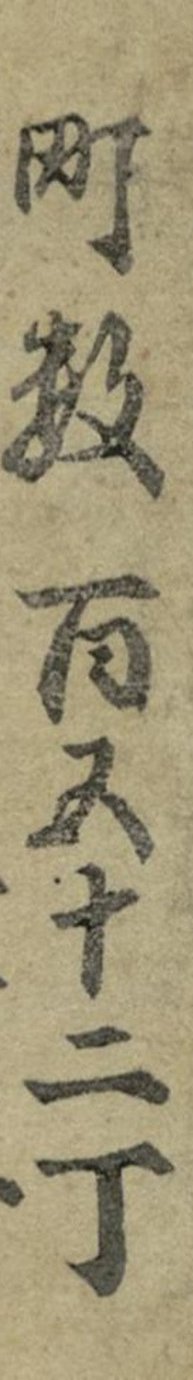町数百五十二丁
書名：大阪今昔三度の大火
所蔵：東京大学地震研究所図書室 Earthquake Research Institute Library, The University of Tokyo, JAPAN
